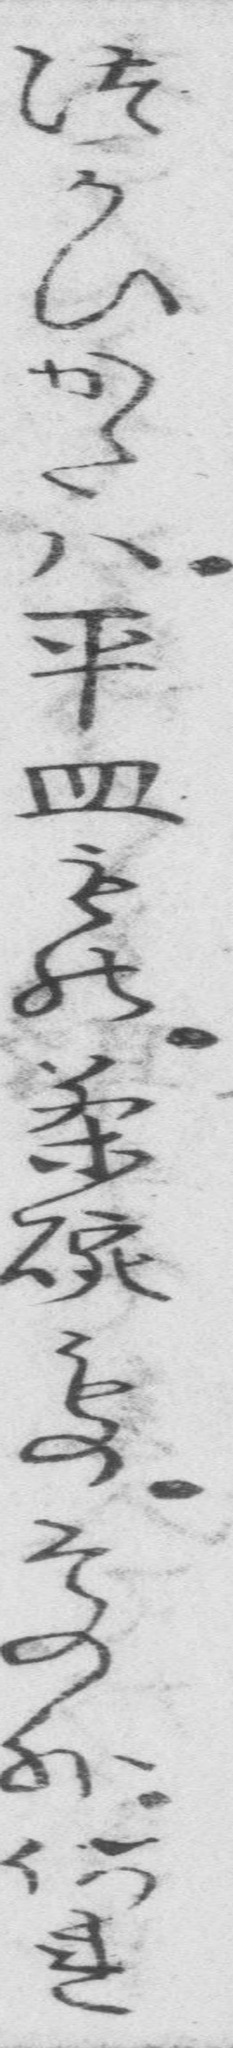つかひかたは。平皿もの。茶碗もの。その外。何れ
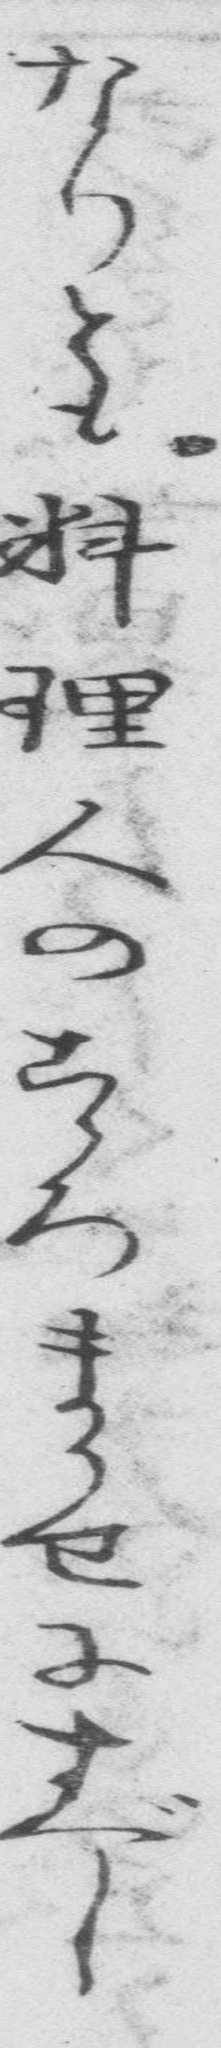なりとも。料理人のこゝろまかせにすべし
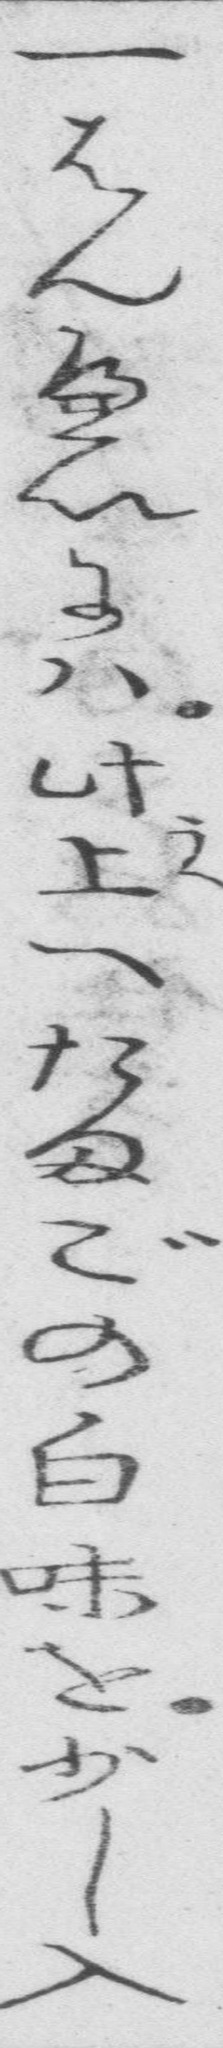一はんへいには。此上へたまごの白味を。少し入
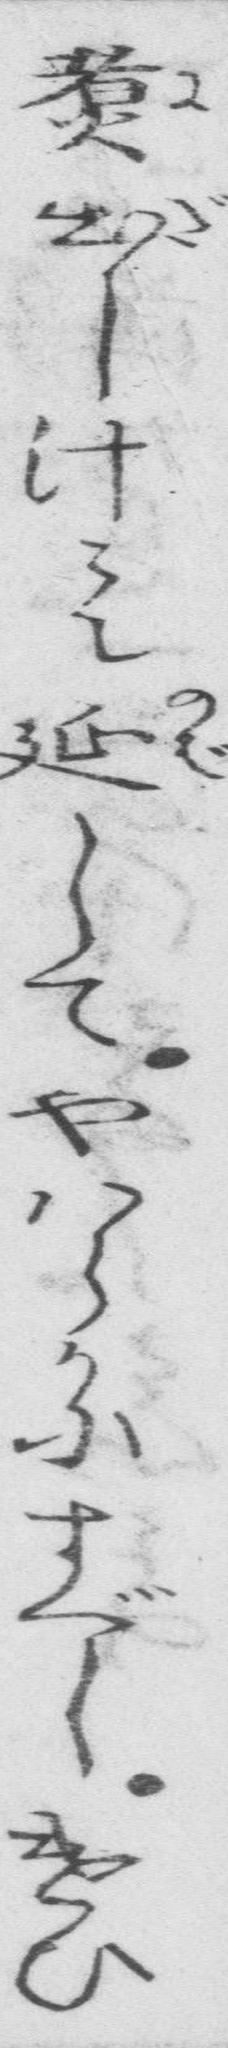煮出し汁にて延して。やはらかにすべし。遣ひ
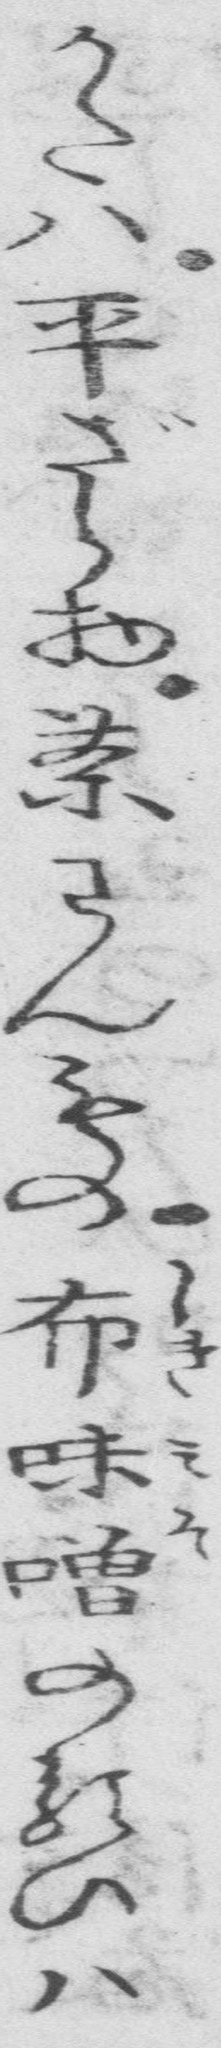かたは。平ざら物。茶わんもの。布味噌の類ひは
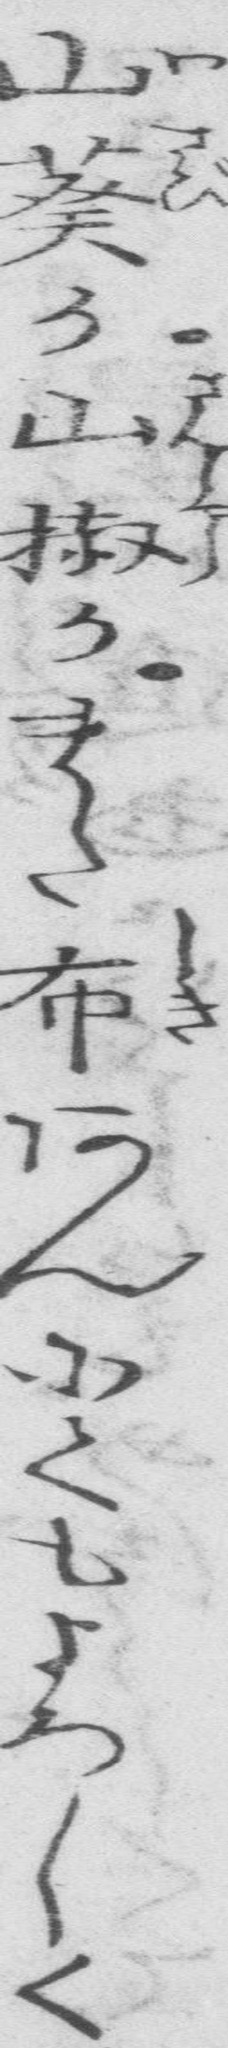山葵か。山椒か。また布あんにてもよろしく

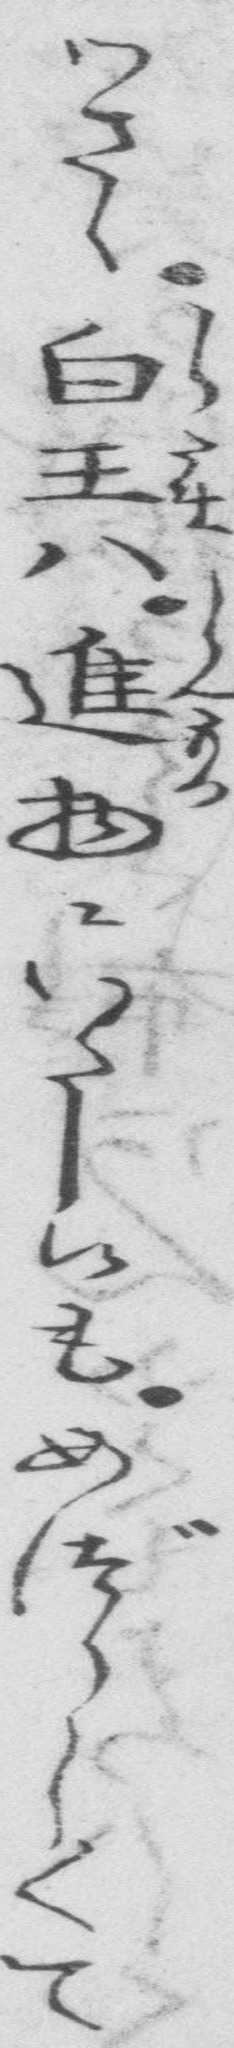わたし。白玉は。進物にいたし候も。めづらしくて
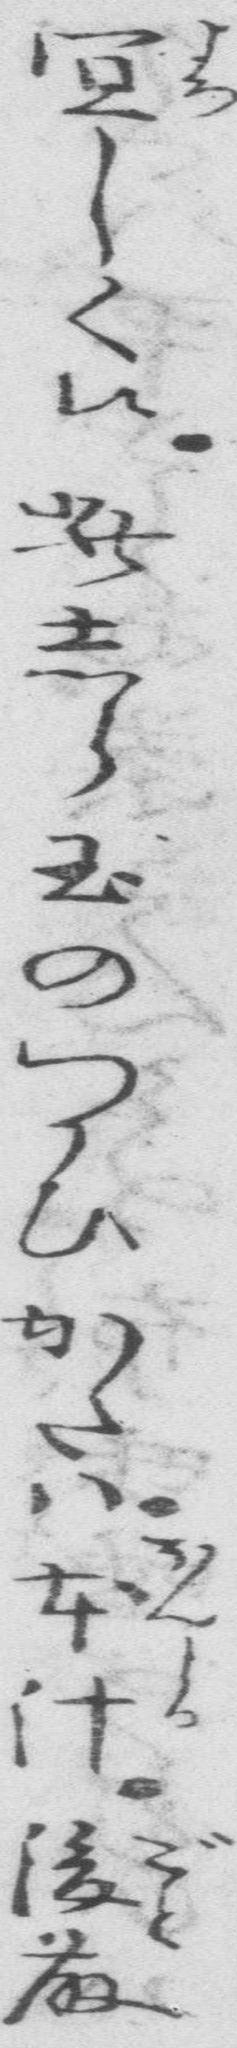宜しく候。此しら玉のつかひかたは、本汁。後藤
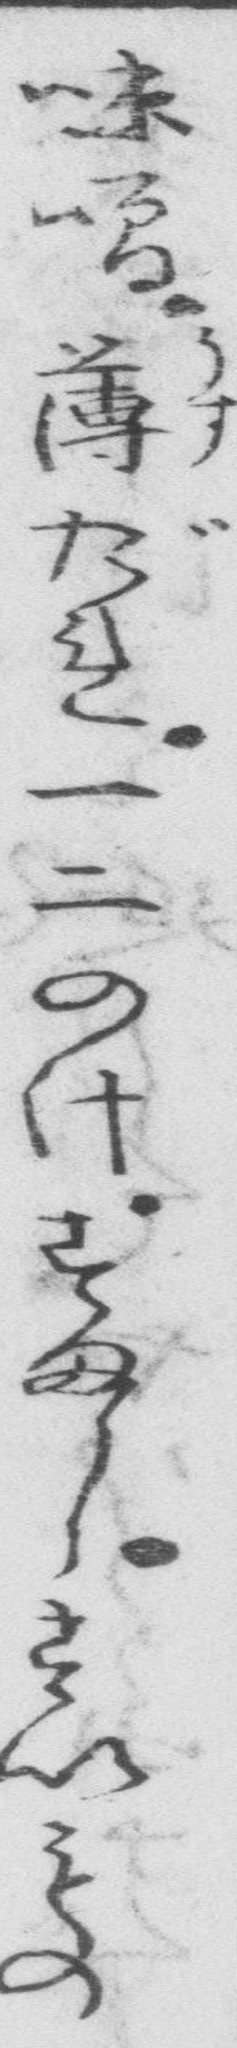味噌。薄だれ。一二の汁。すまし。すいもの
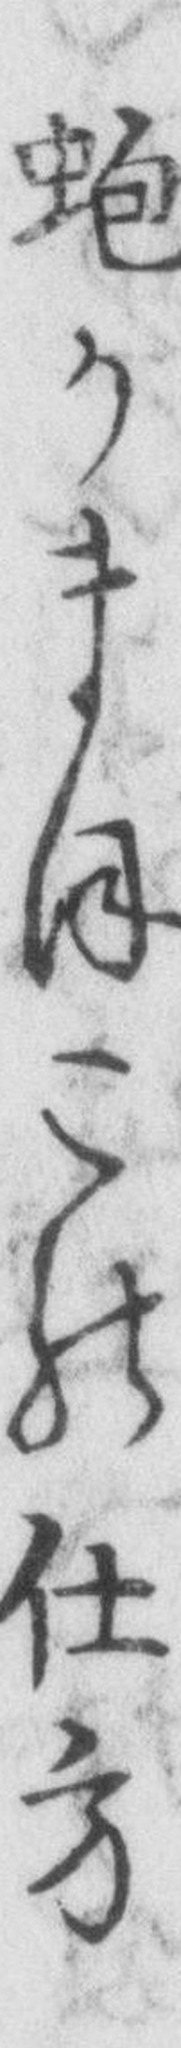鮑かまぼこの仕方
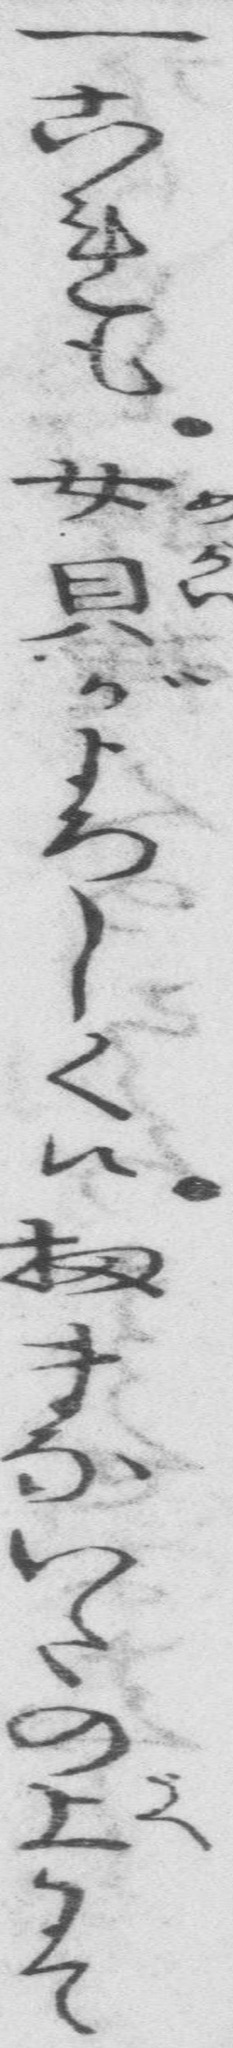一これも。女貝がよろしく候。扨まないたの上にて
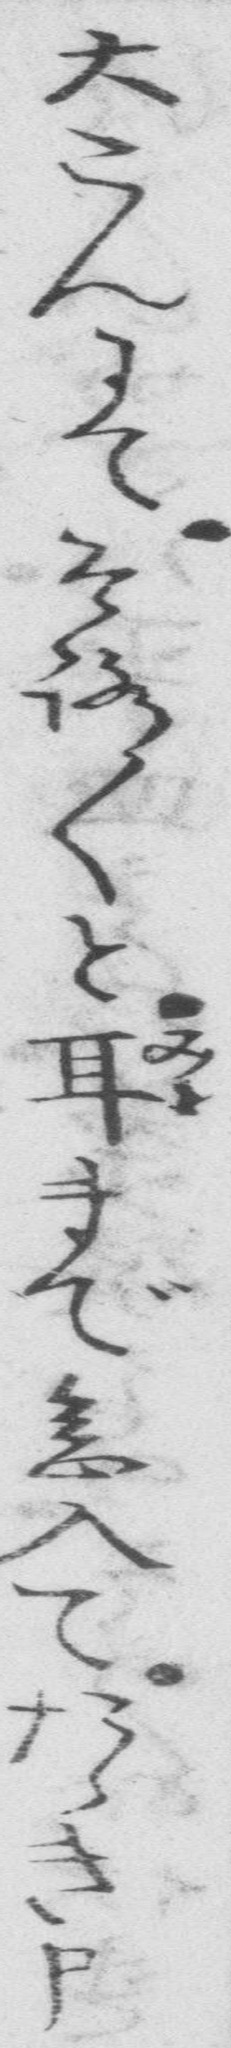大こんにて。そろ〳〵と。耳まで念入て。たゝき申
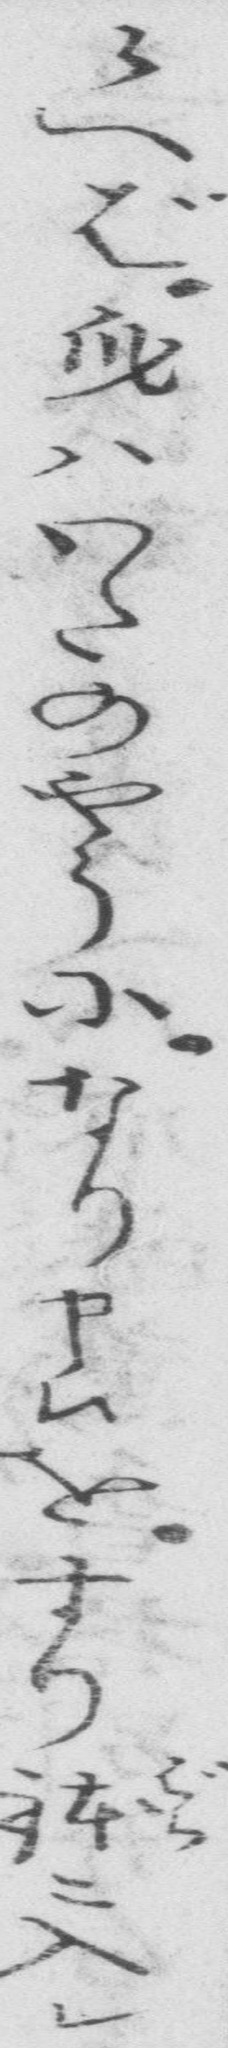候へば。身はわたのやうに。なり申候を。すり鉢に入れ
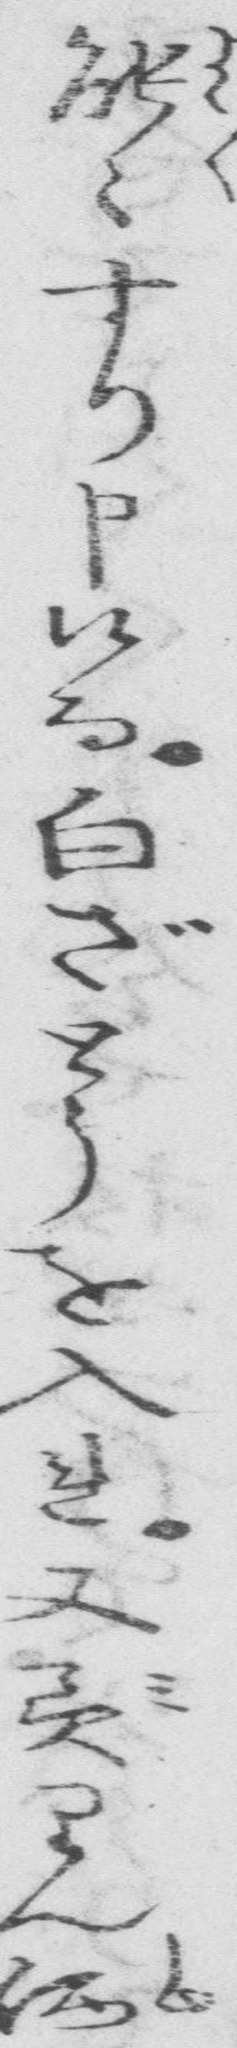能々すり申候而。白ざとうを入れ。又美りん酒
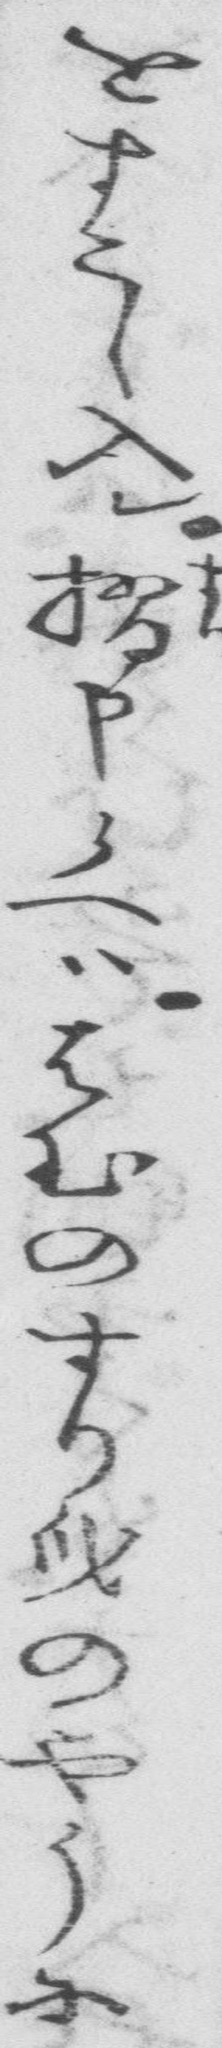をすこし入れ。摺申候へは。はむのすり身のやうに
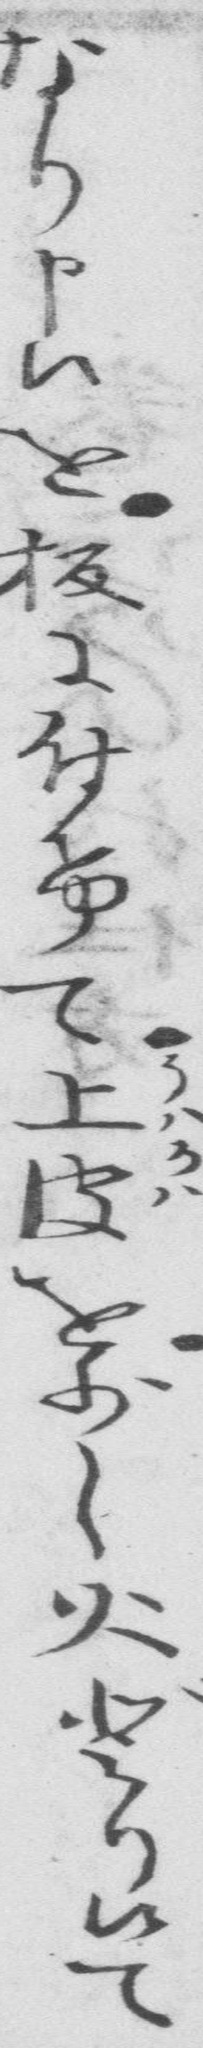なり申候を。板に付けて。上皮を。少し火どり候て
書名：萬寳料理秘密箱
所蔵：大阪府立大学学術情報センター 国文学研究資料館
